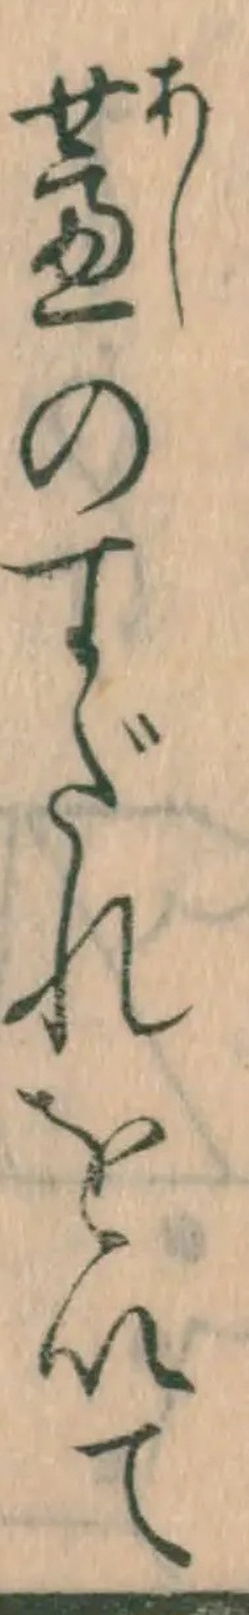蘆のすだれを以て
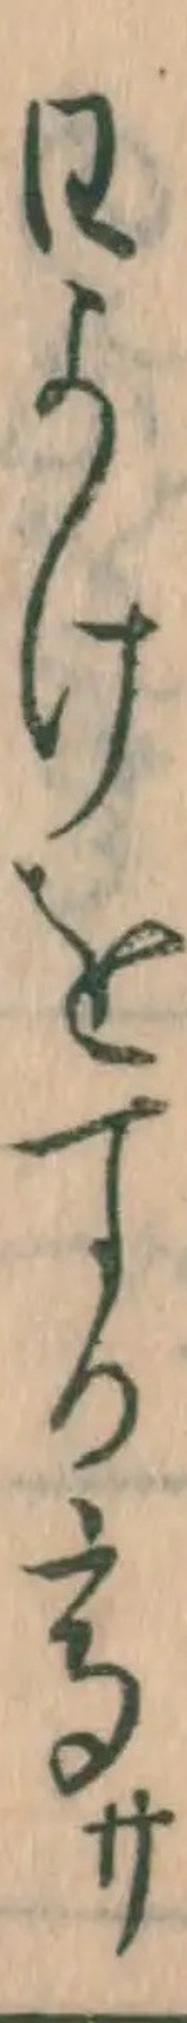日よけをする高
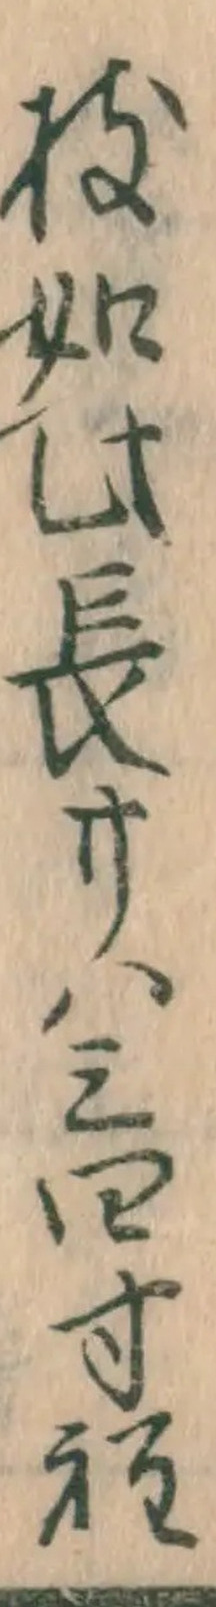枝如此長さは三四寸程
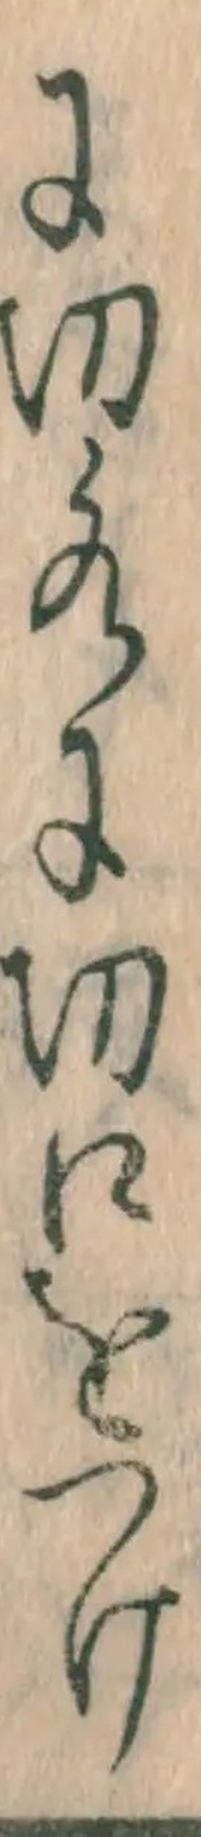に切水に切口をつけ
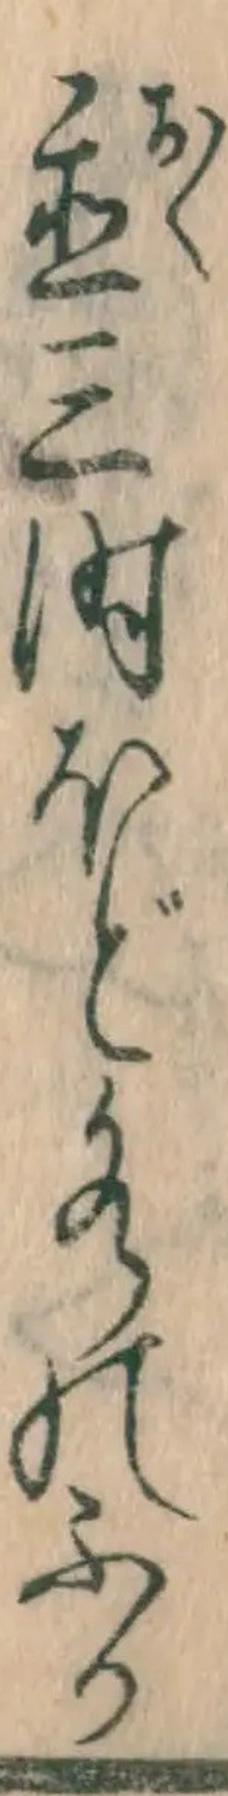置三時ほど水のふか
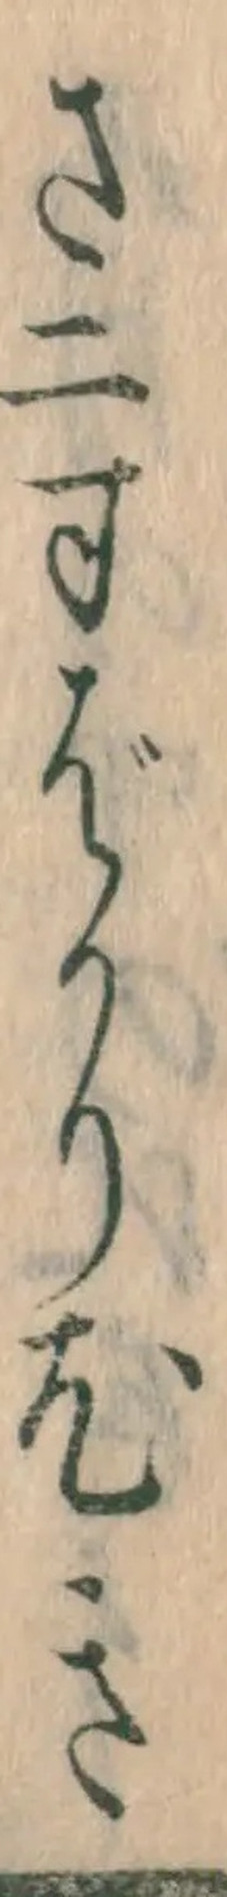さ二寸ばかり尤き
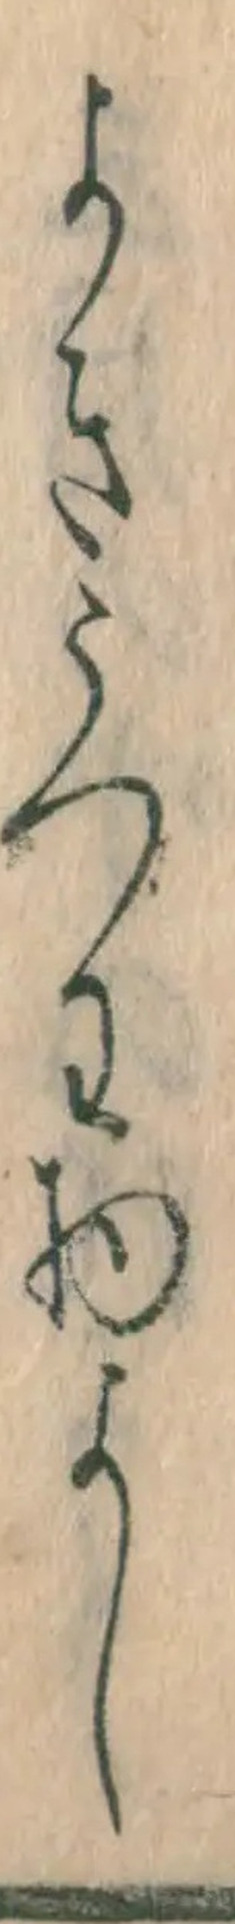よきうつわ物よし
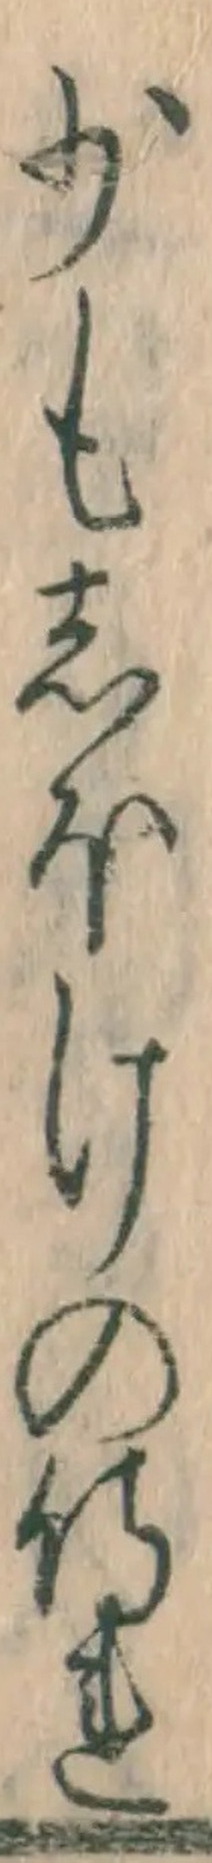少もしほけの侍れ

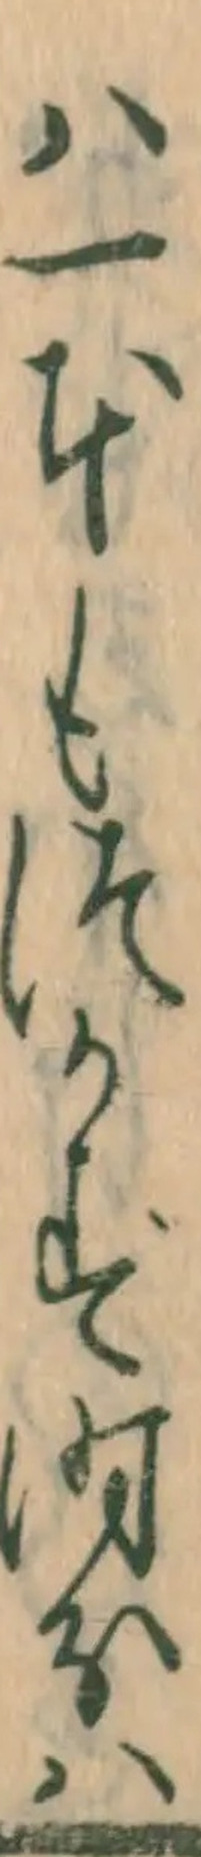は一本もつかず時分は
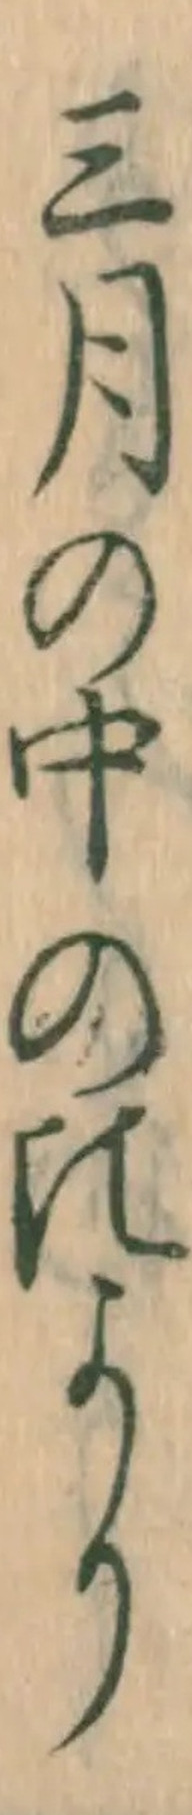三月の中の頃より
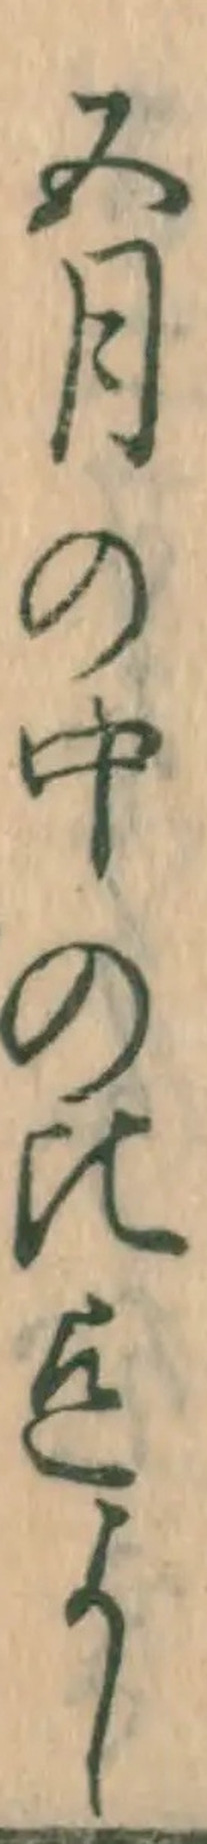五月の中の頃迄よし
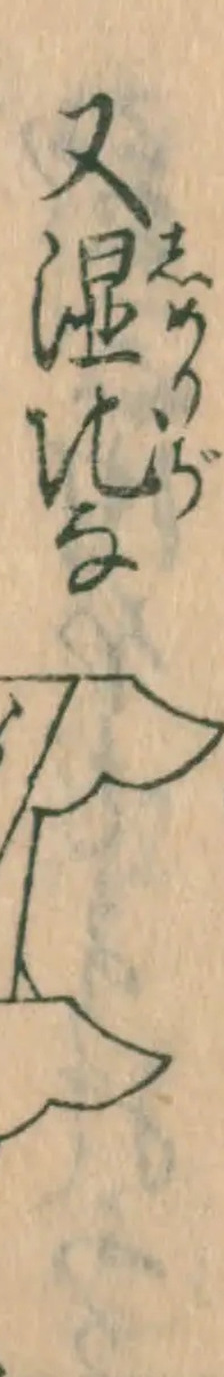又湿地な
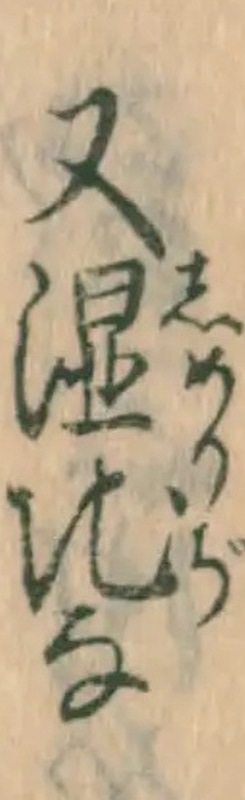又湿地な
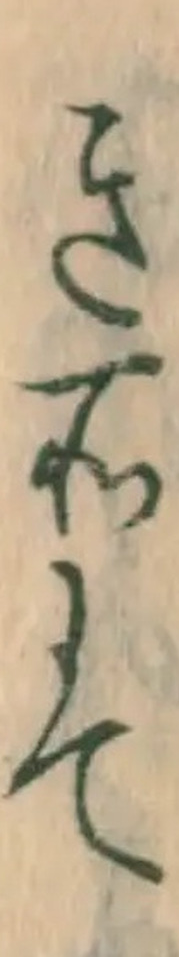き所にて
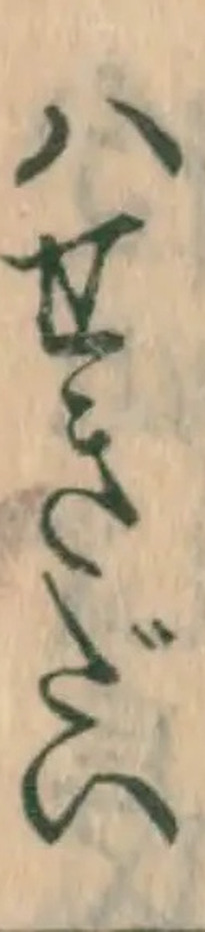はせきだい
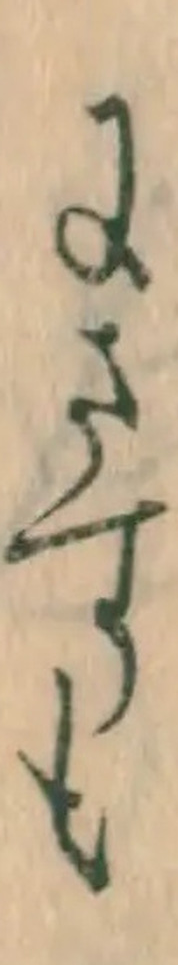にさすも
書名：錦繍枕 5巻. [5]
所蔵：国立国会図書館 National Diet Library, JAPAN
